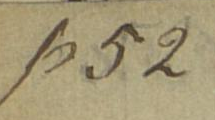p52
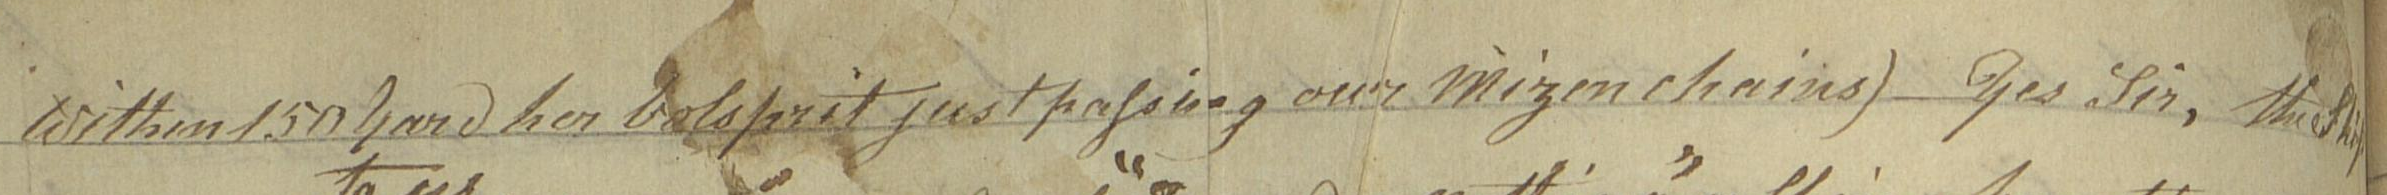Within 150 Yard her bolsprit just passing our Mizen chains) Yes Sir, the Ship
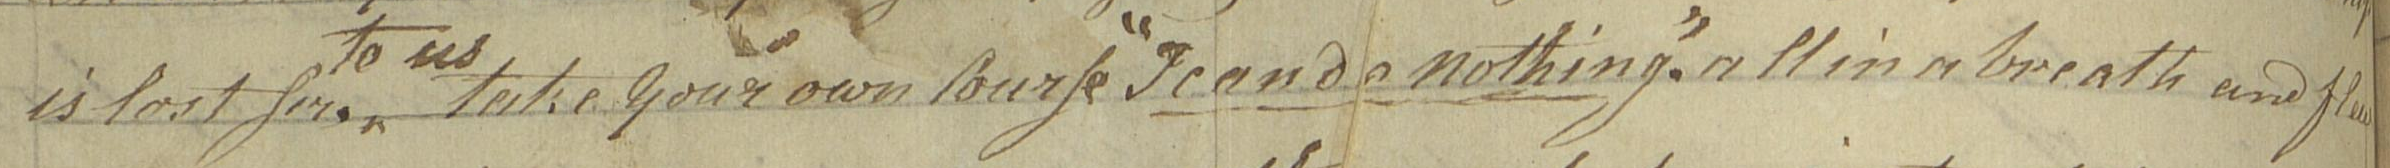is lost Sir, ^ take your own Burse "I can do nothing." all in a breath and flu-
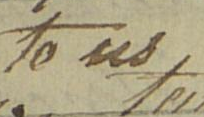to us
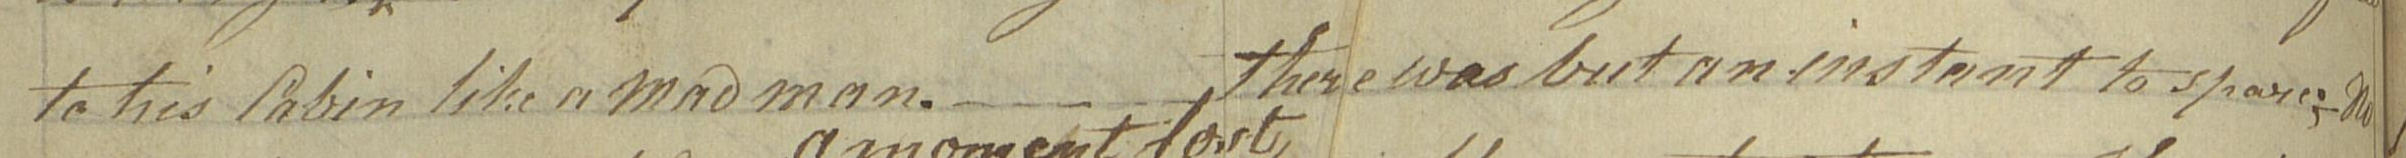to his Cabin like a mad man. there was but an instant to spare; No
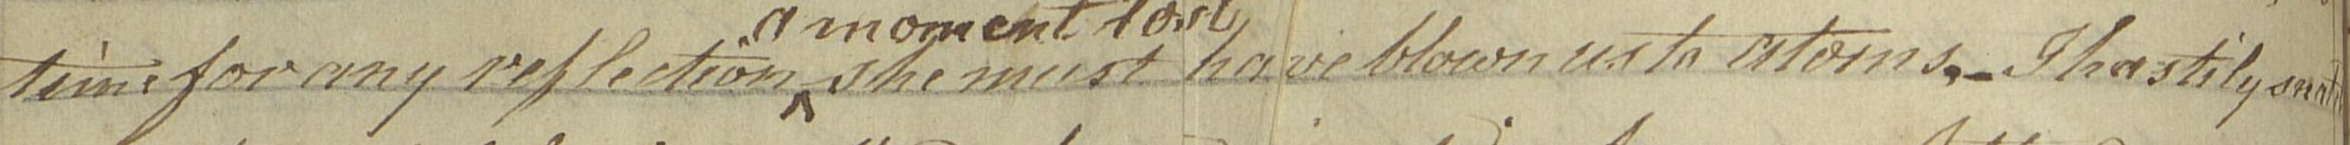time for any reflection ^ she must have blown us to atoms, I hastily sna-
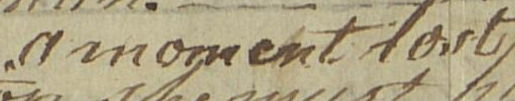a moment lost
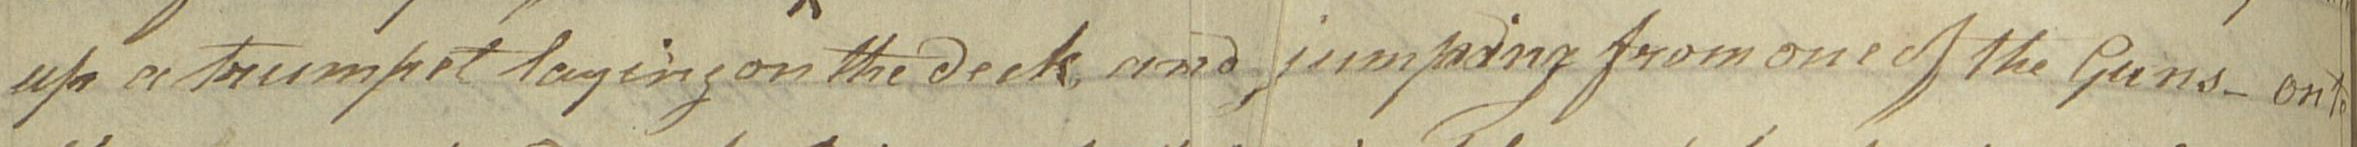up a trumpet laying on the deck and jumping from one of the Guns, on to
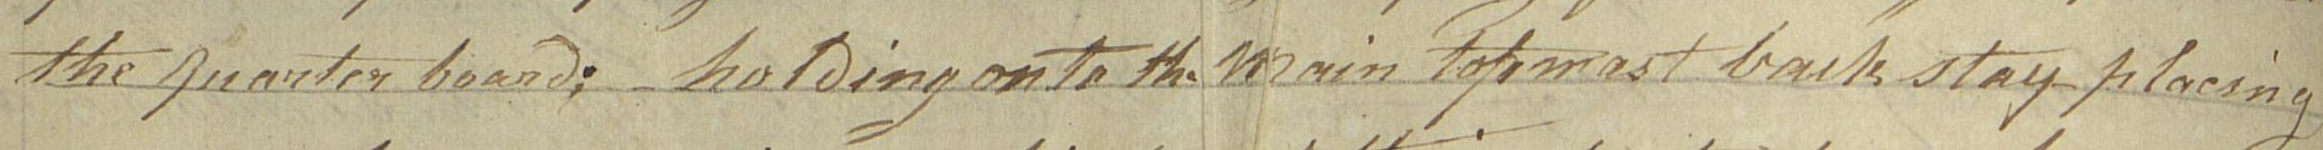the quarter board; holding onto the main topmost back stay placing
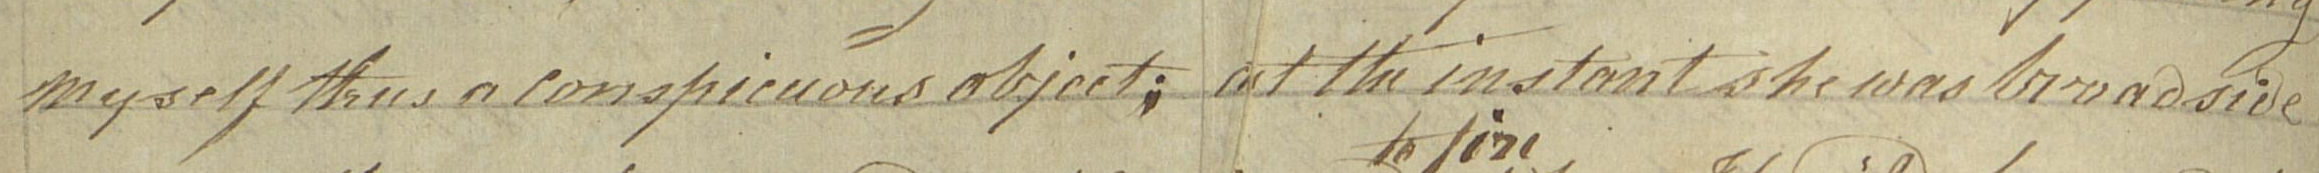myself thus a conspicuous object; at the instant she was broadside
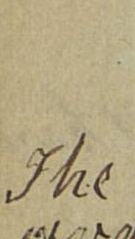The
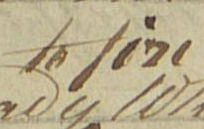to fire
